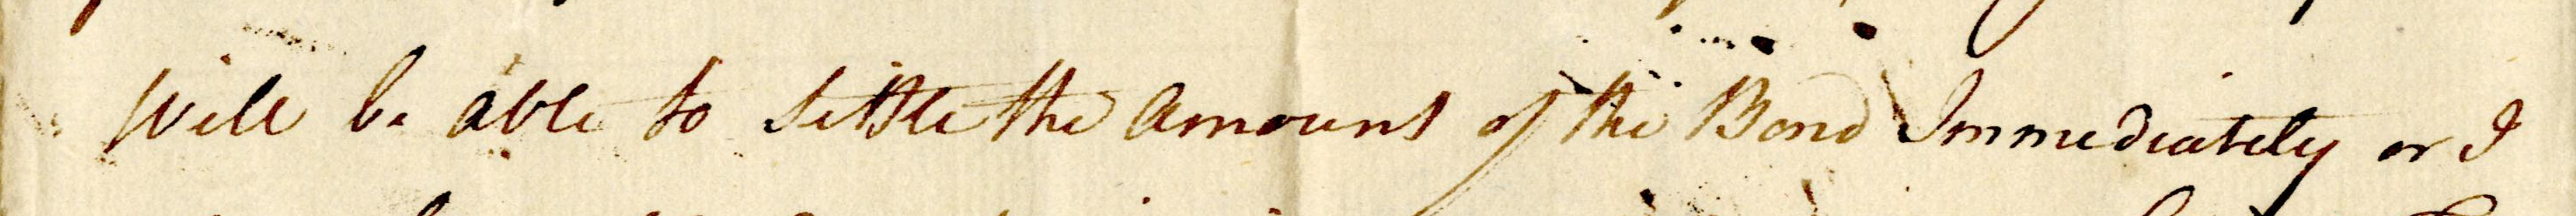will be able to settle the Amount of the Bond Immediately or I
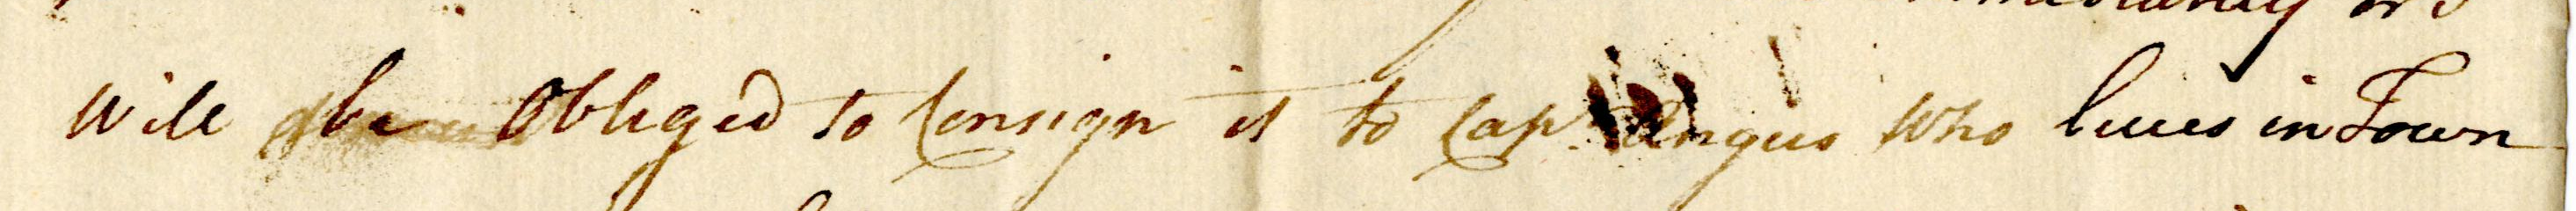will be Obliged to Consign it to Cap^t Angus who lives in Town
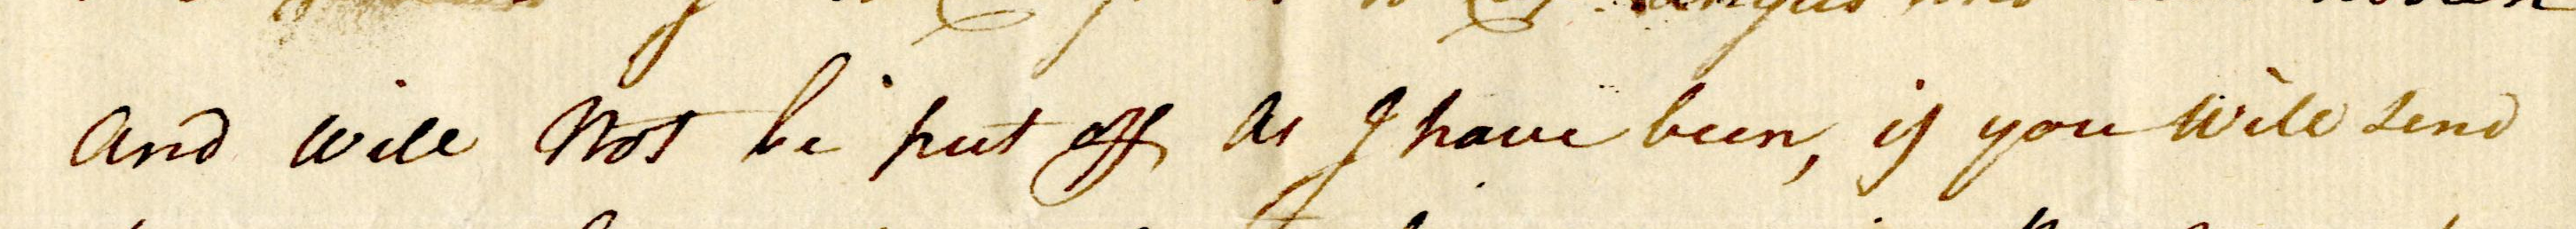And will not be put off As I have been if you Wild send
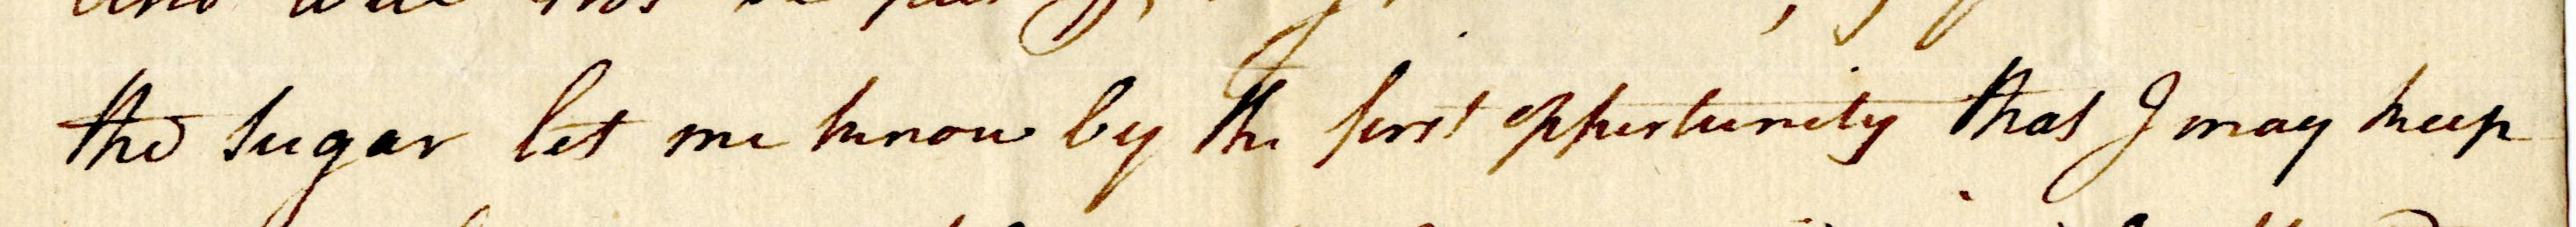the Sugar let me know by the first opportunity that I may keep
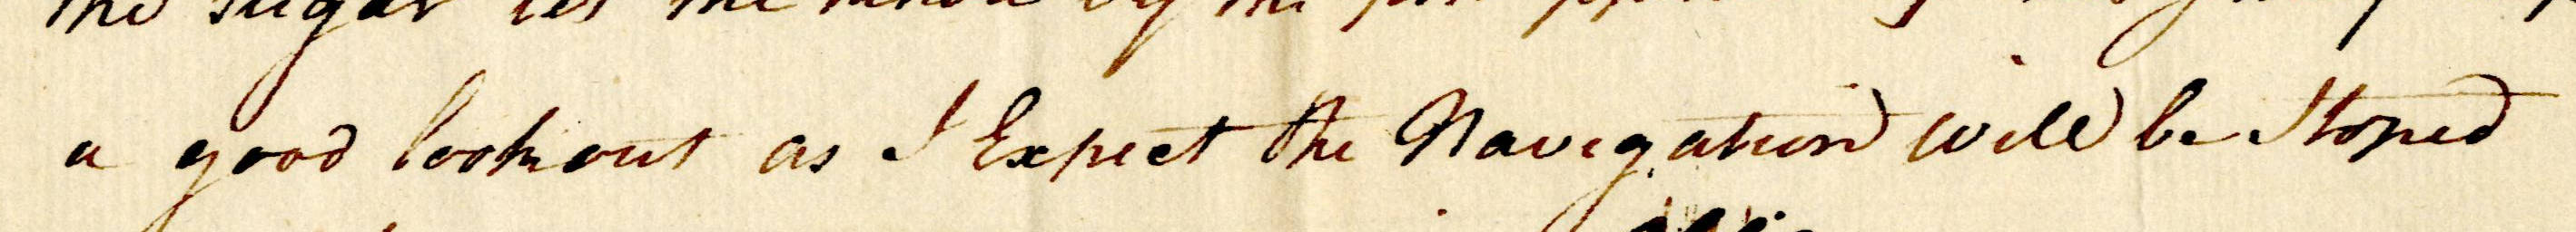a good lookout as I Expect the Navigation will be Stoped
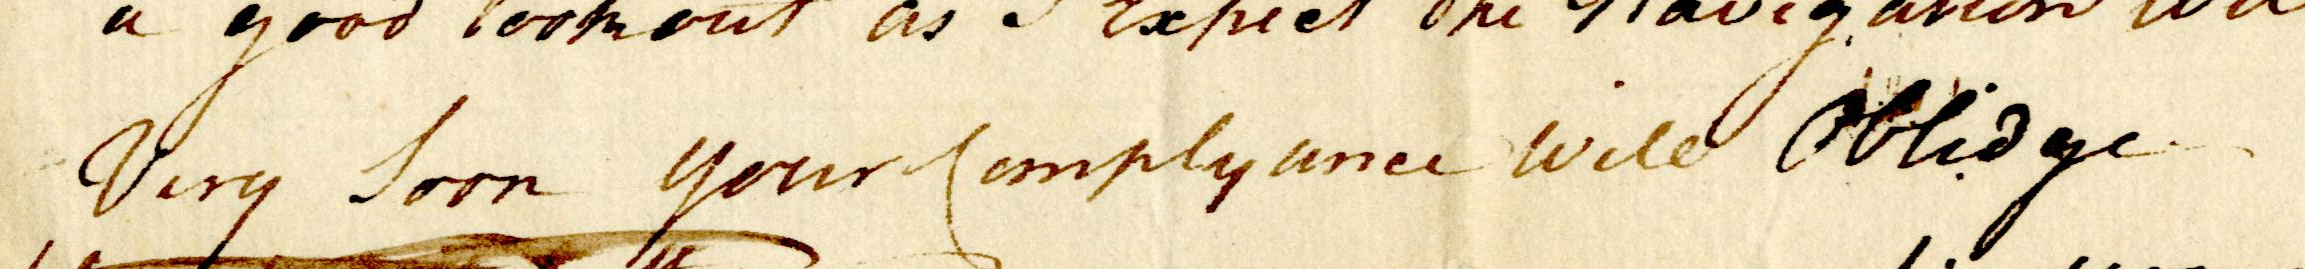Very soon your Complyance will Oblidge
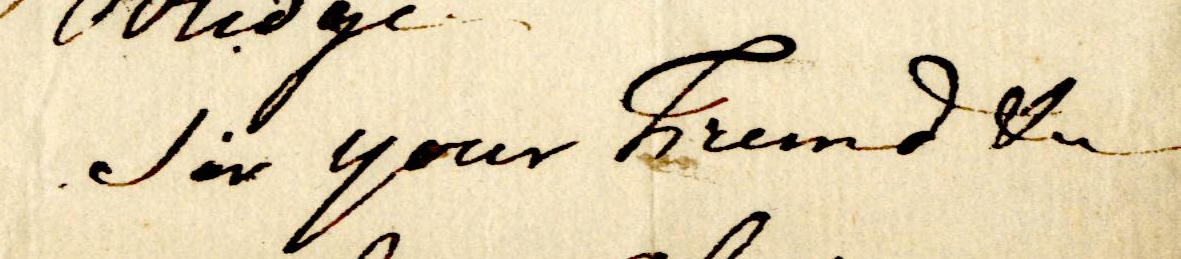Sir your friend &c
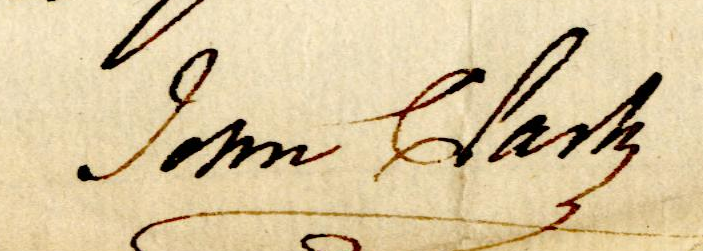John Clark
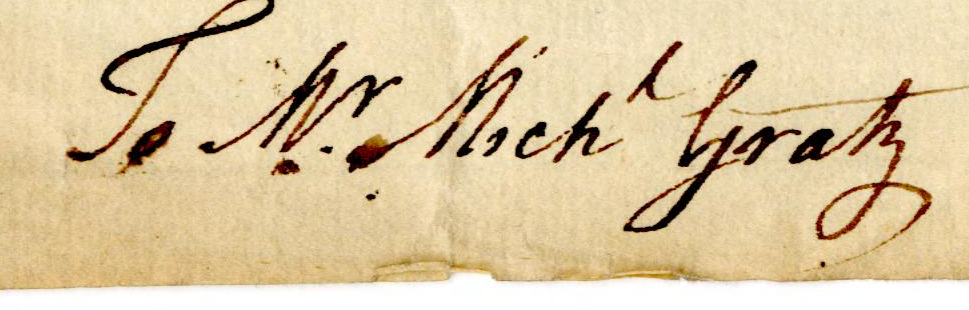To M^r Mich^l Gratz
